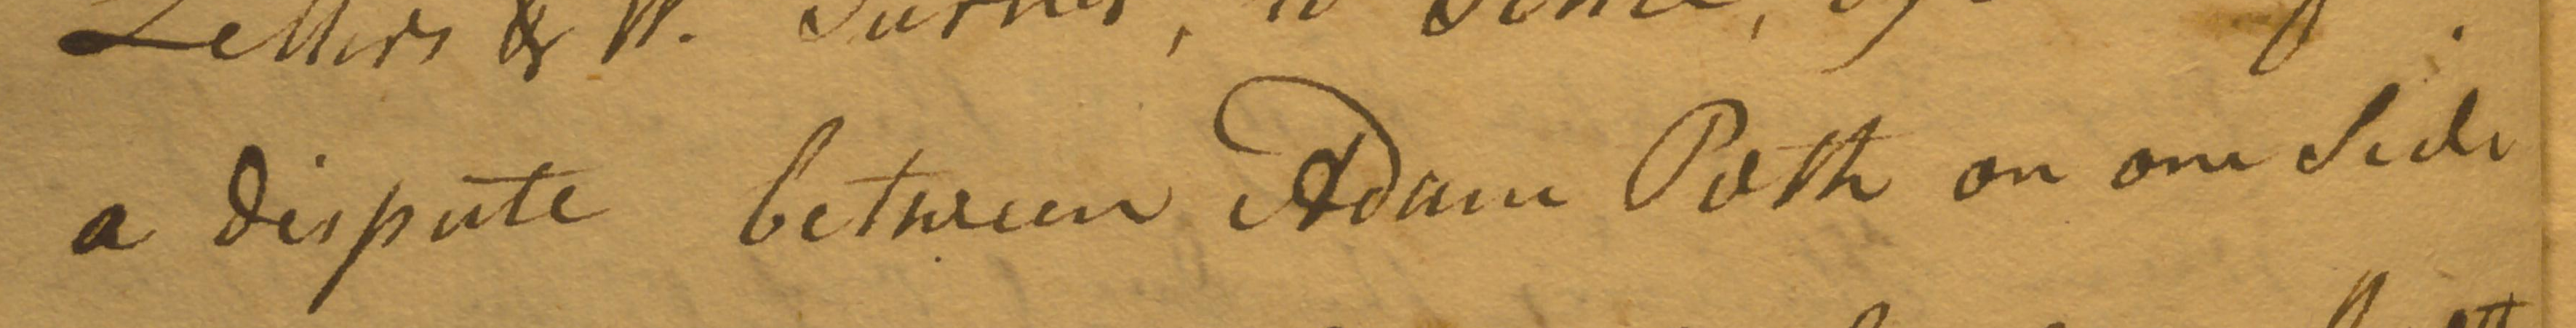a dispute between Adam Poth on one side
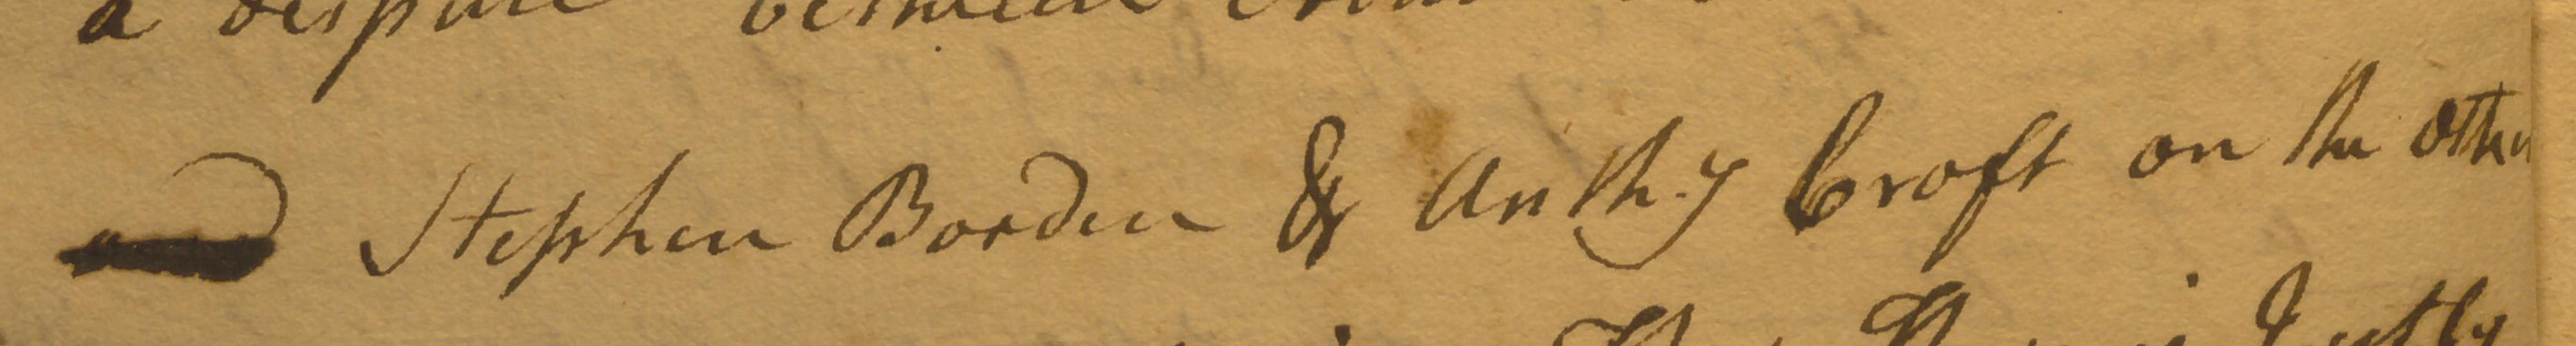[and] Stephen Borden & Anth^y. Croft on the other
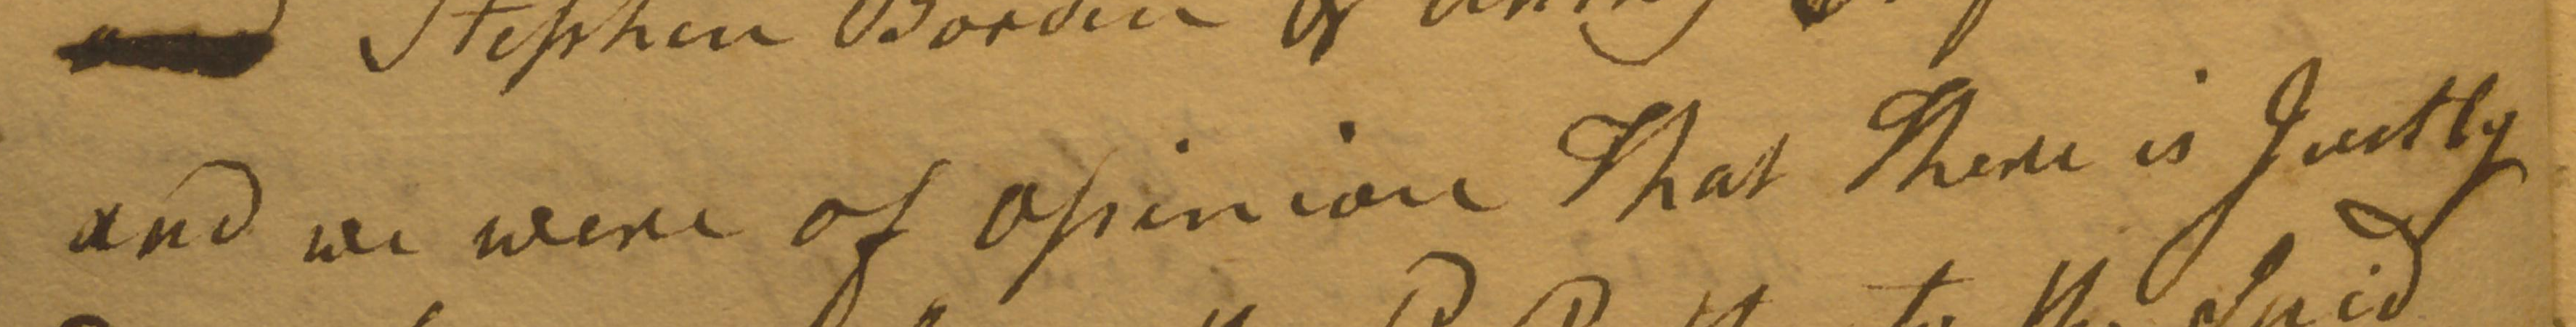and we were of opinion That There is Justly
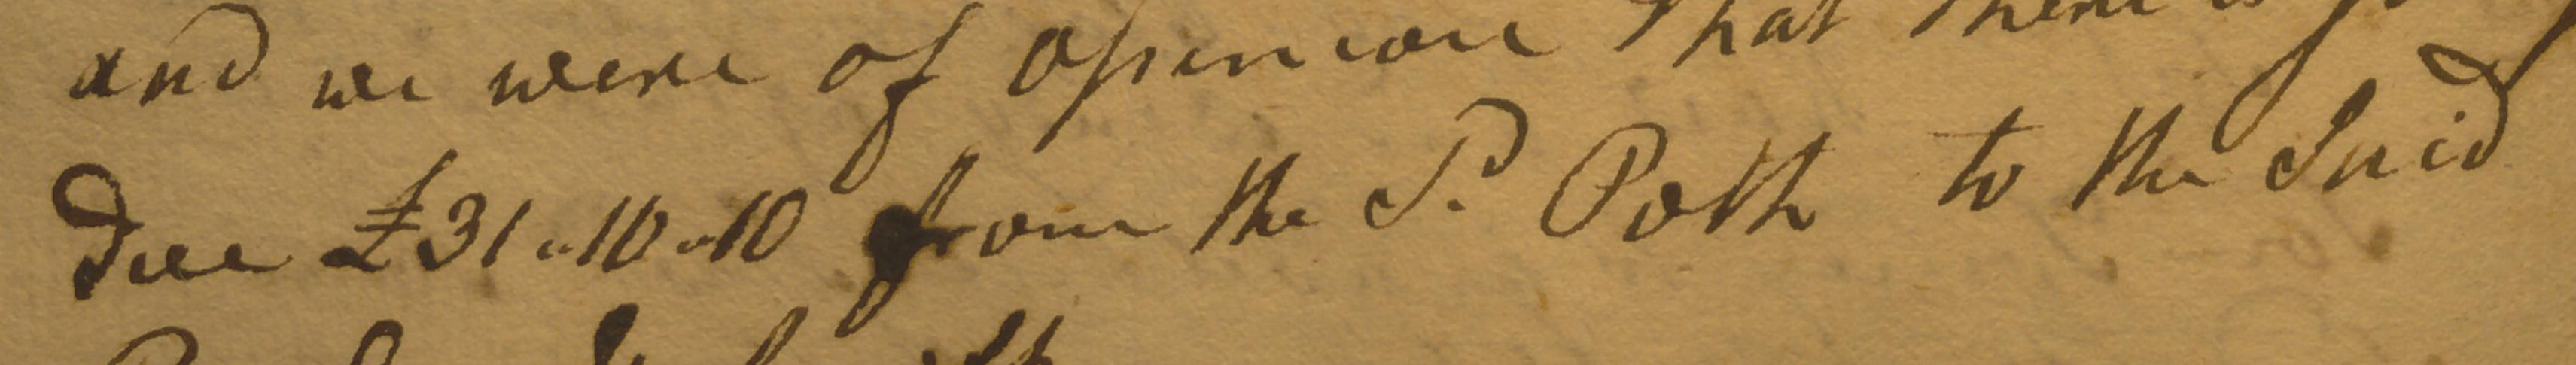due £31.10.10 from the s^d. Poth to the Said
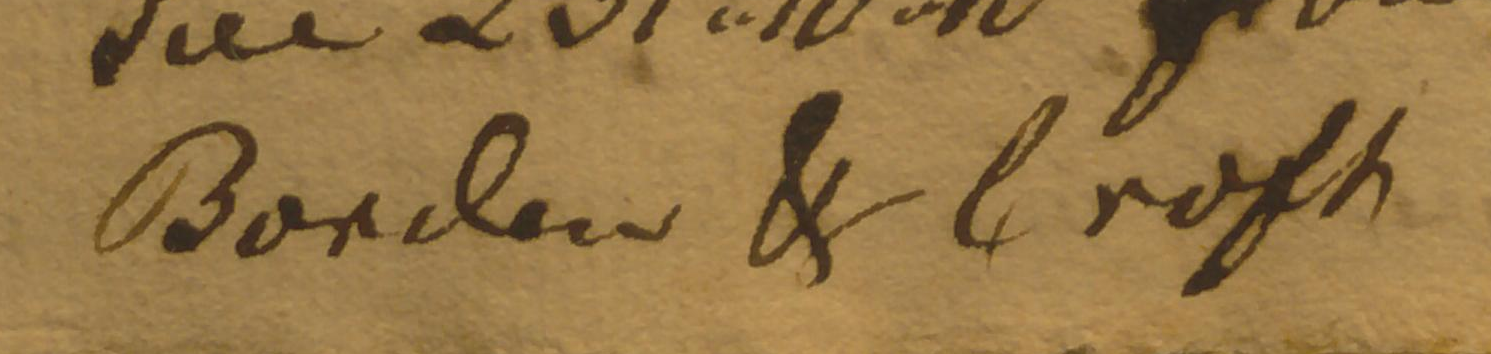Borden & Croft
